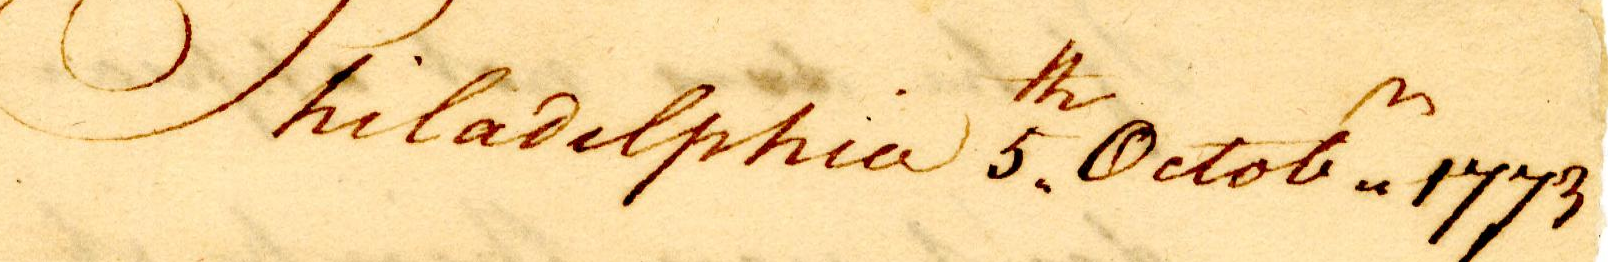Philadelphia 5^th. Octob^r. 1773.
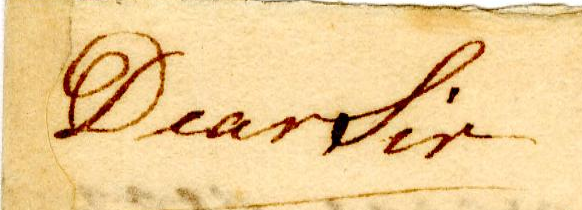Dear Sir
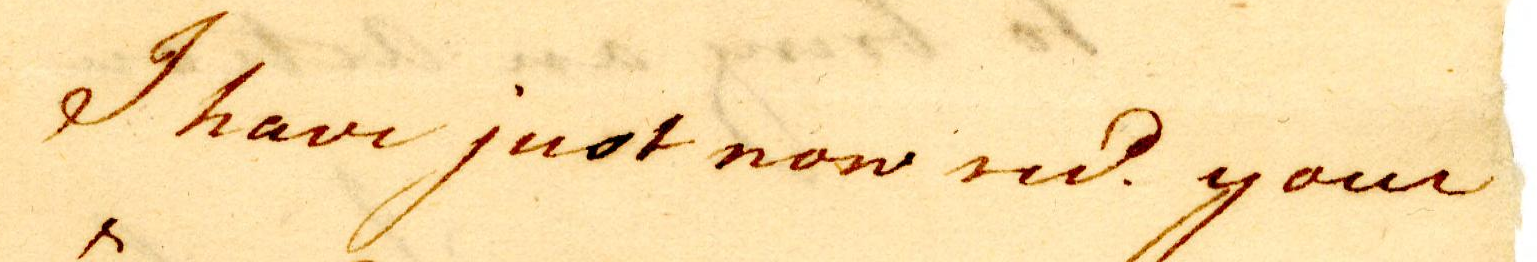I have just now rec^d. your
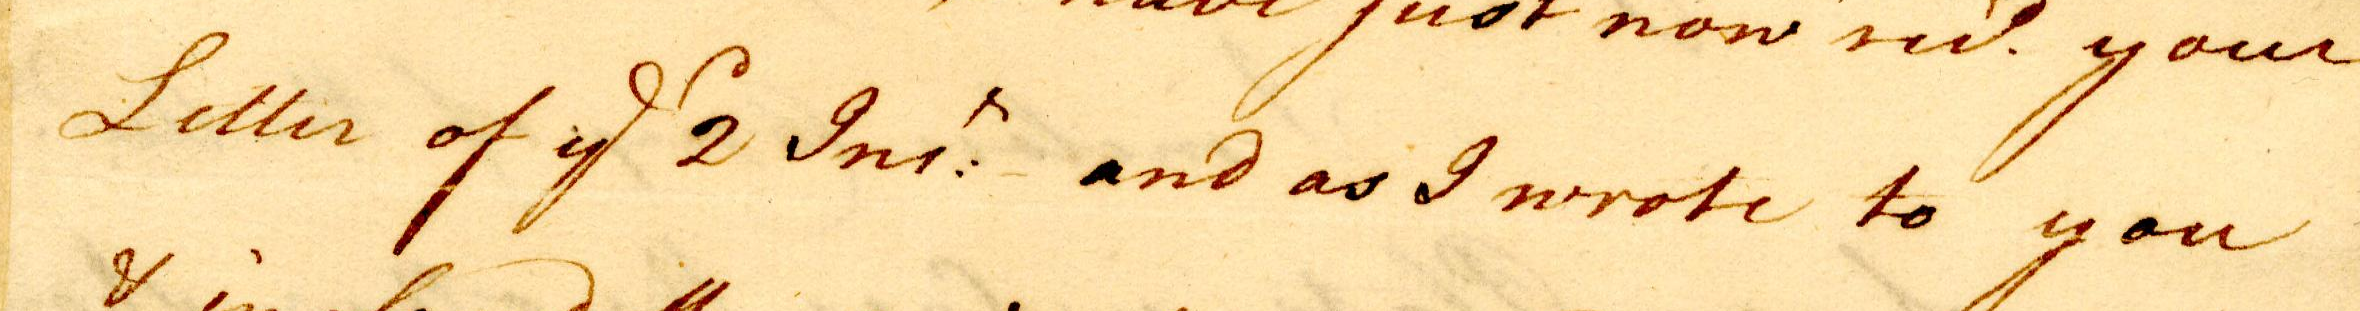Letter of y^e 2^d Ins^t: and as I wrote to you
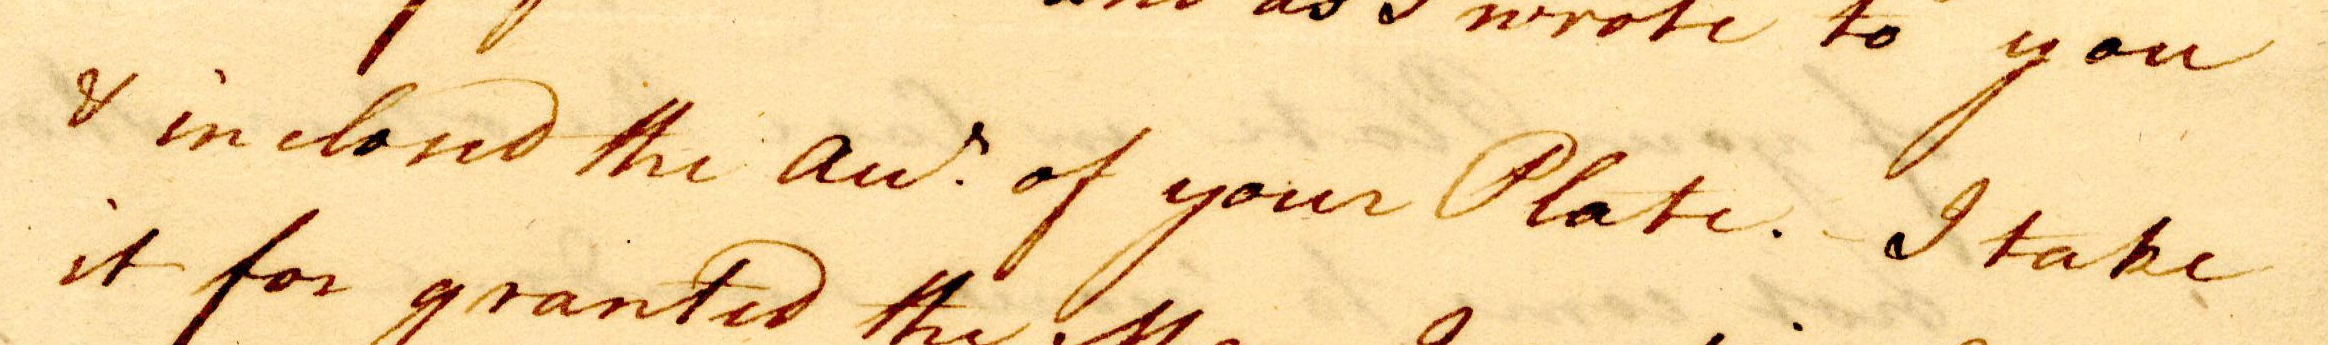& inclosed the au^t. of your Plate. I take
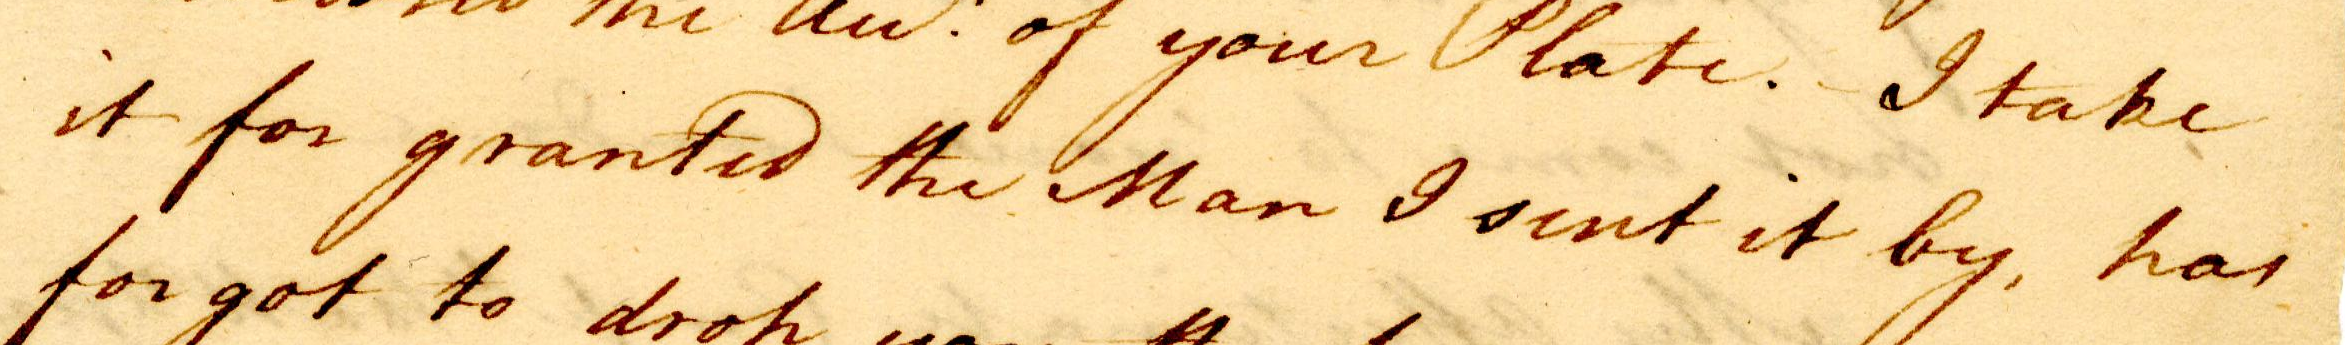it for granted the Man I sent it by, has
